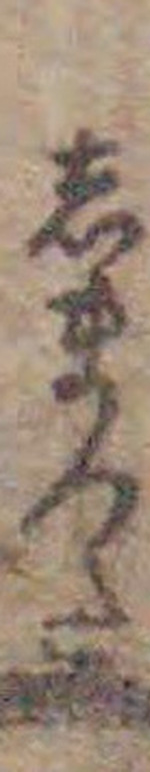しまつた
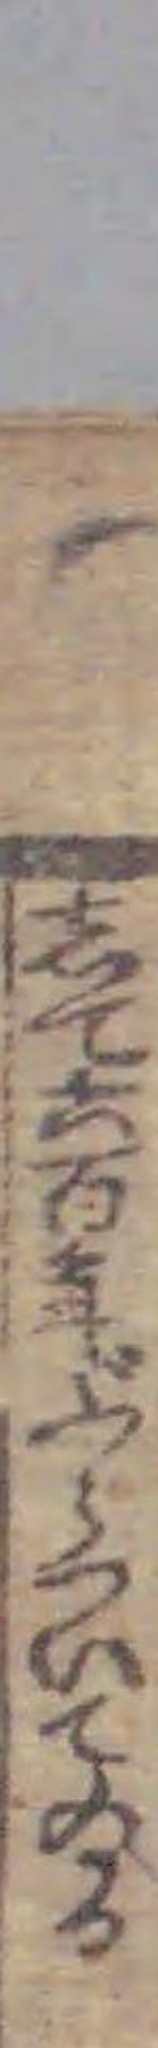して六百年ぶらついてゐる
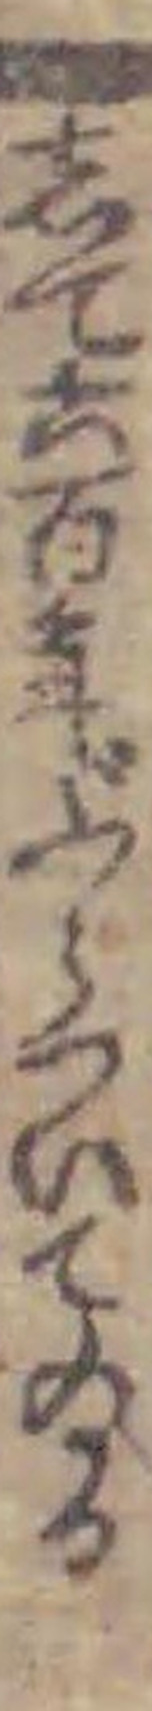して六百年ぶらついてゐる

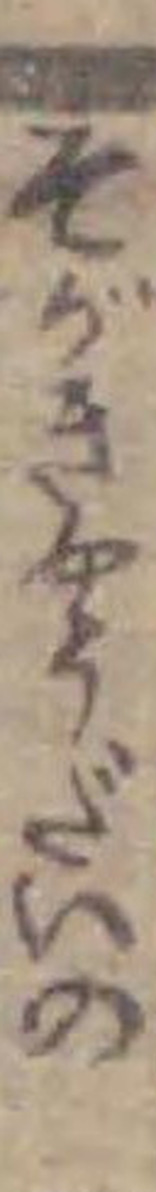そがきやうだいの
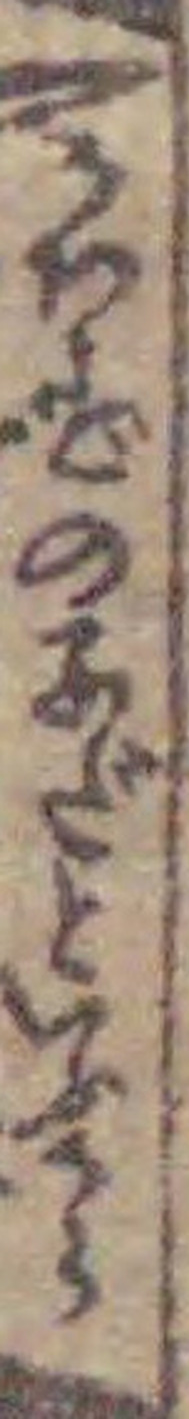かわずの子だといふから
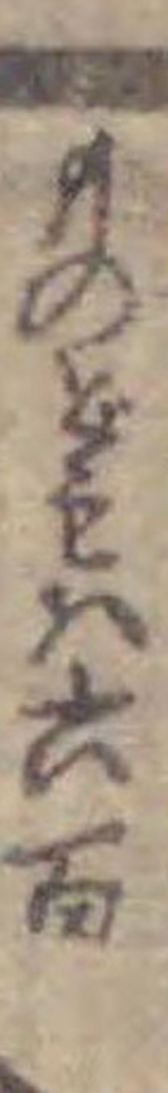ものどもは六百
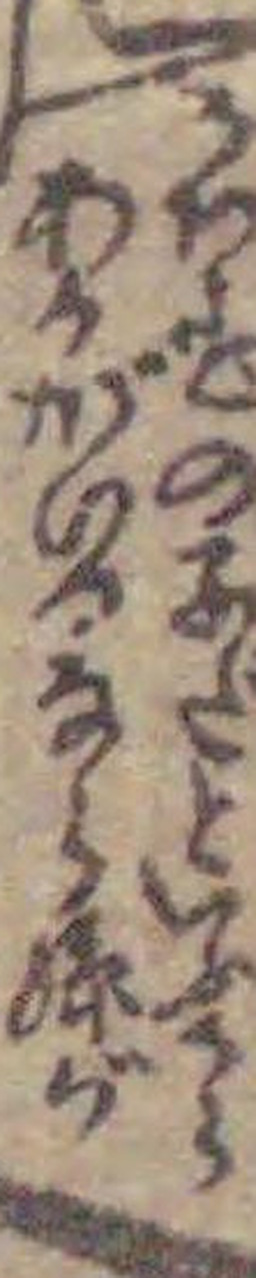あかがいるなら妹が
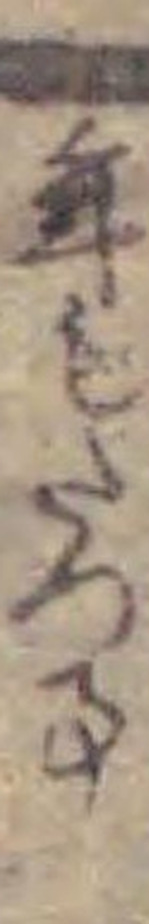年もたつ事
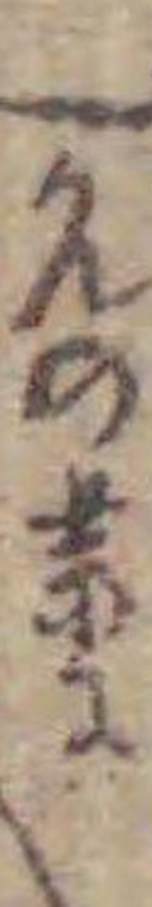かんの薬に
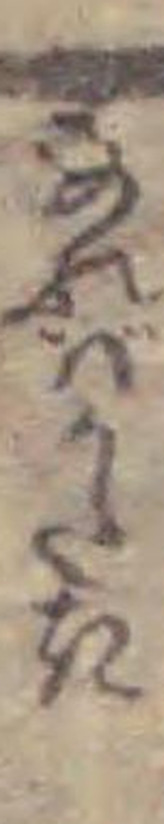なればかたき
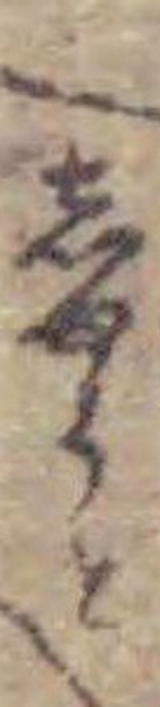しやうと
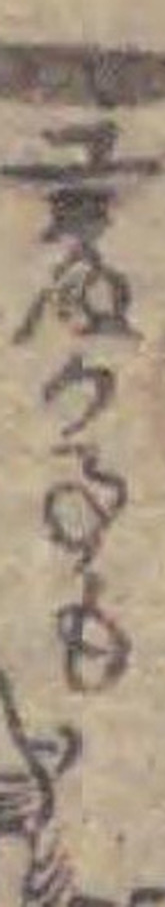工藤か事も
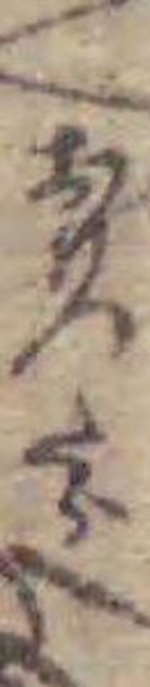おもつたら
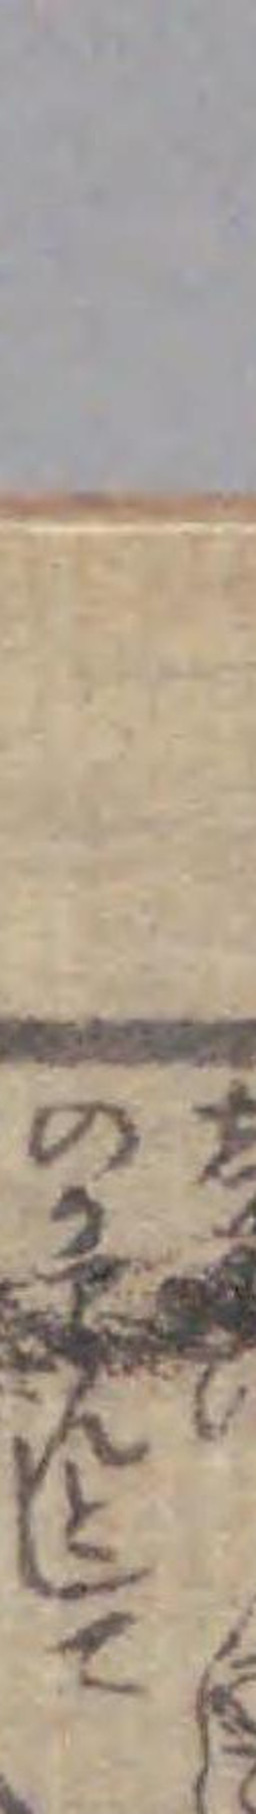のかりんとして
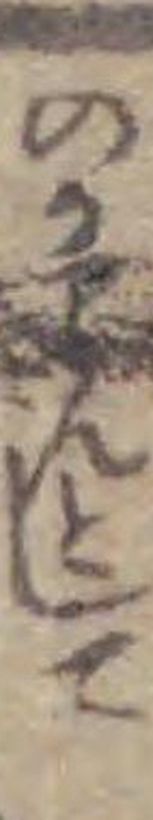のかりんとして
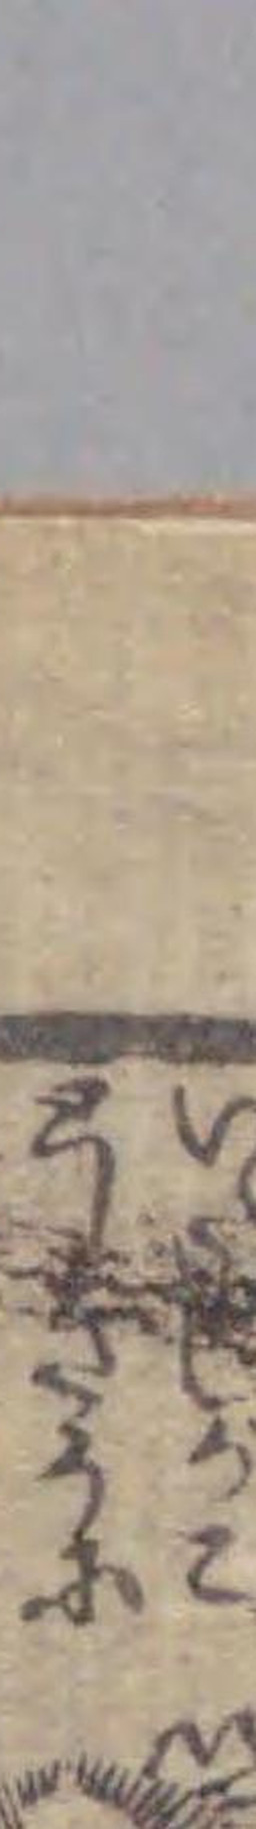としきうに
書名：年寄之冷水曽我 : 3巻
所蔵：国立国会図書館 National Diet Library, JAPAN
